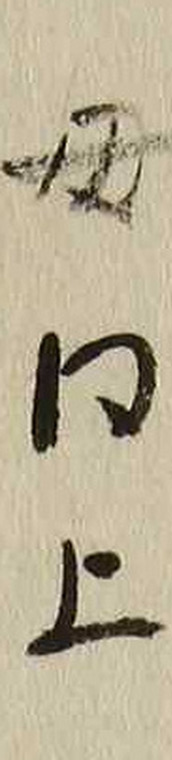母同上
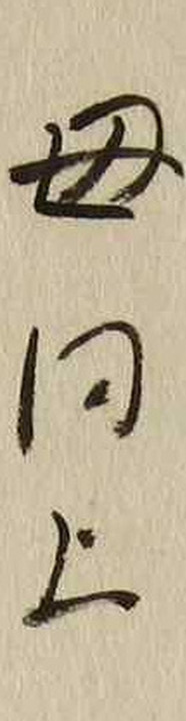母同上
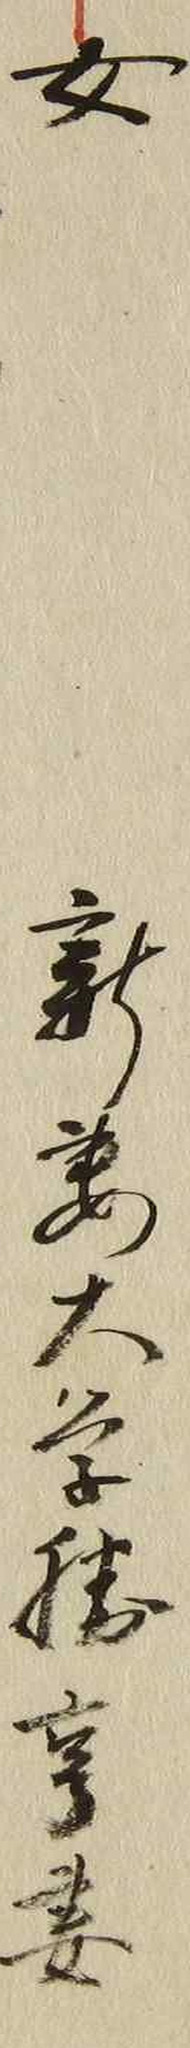女新妻大学勝享妻
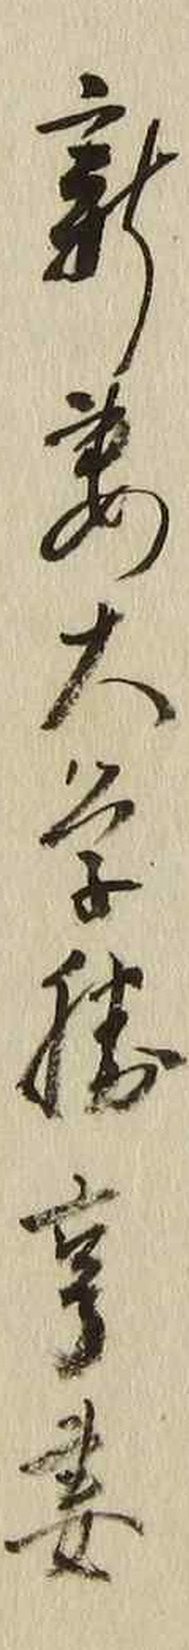女新妻大学勝享妻
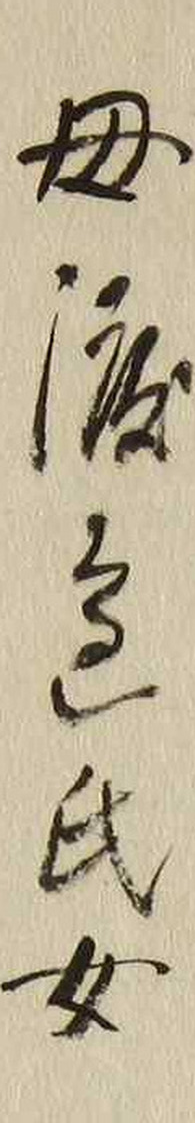母渡辺氏女
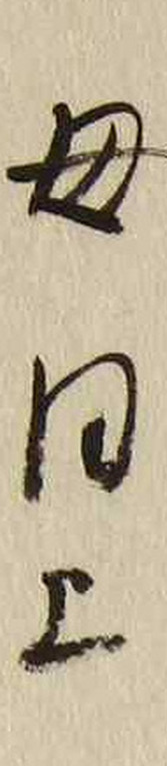母同上

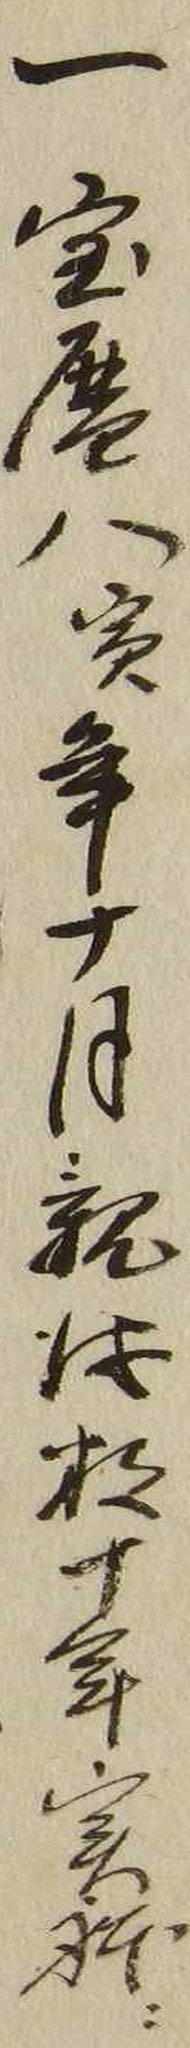一宝暦八寅年十月親儀数十年実体ニ
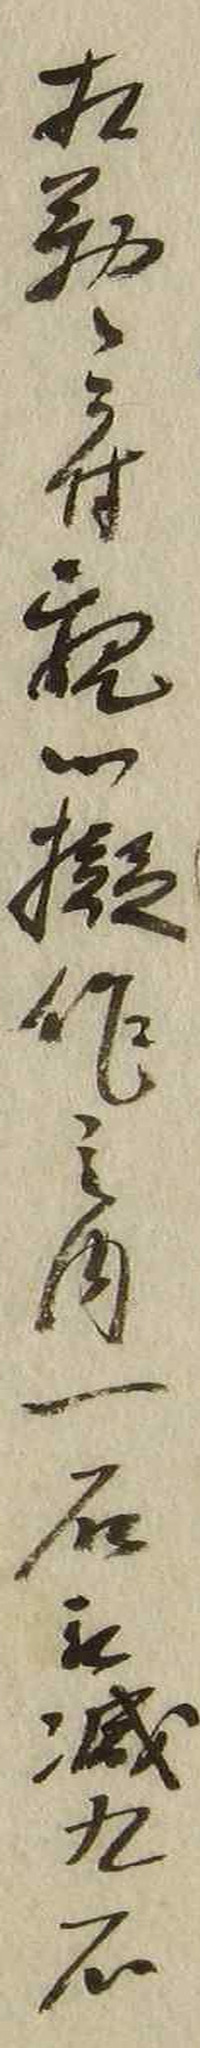相勤候ニ付親御擬作之内一石被減九石
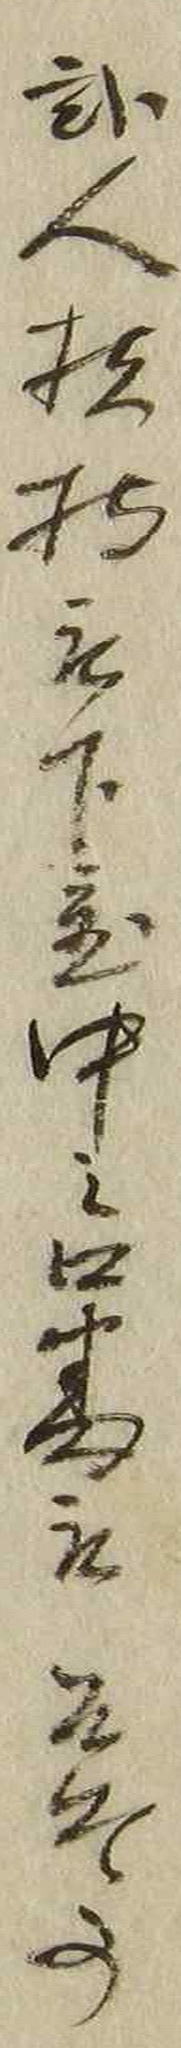弐人扶持被下置中之口番被召出候事
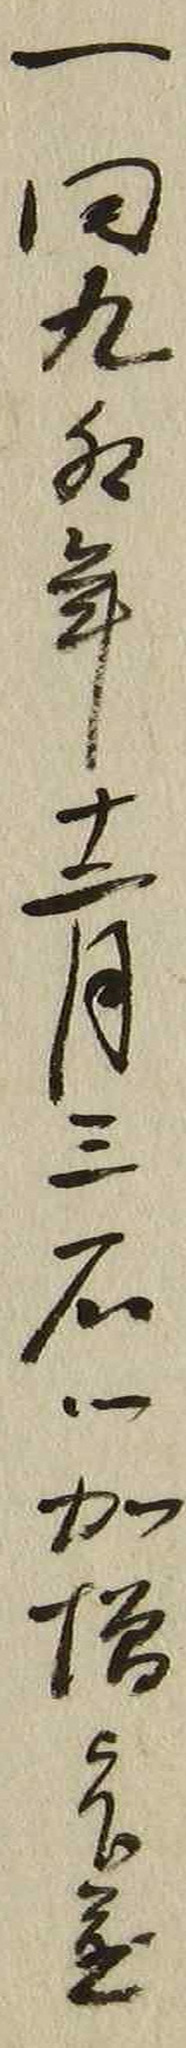一同九卯年十二月三石御加増被下置
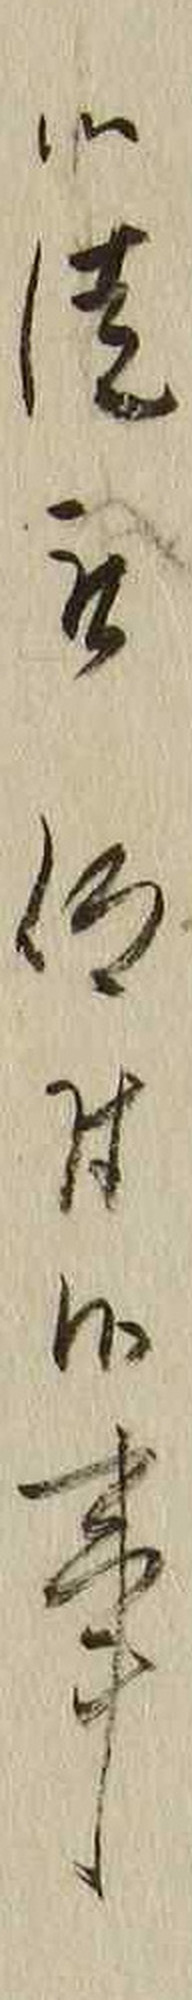御徒被仰付候事
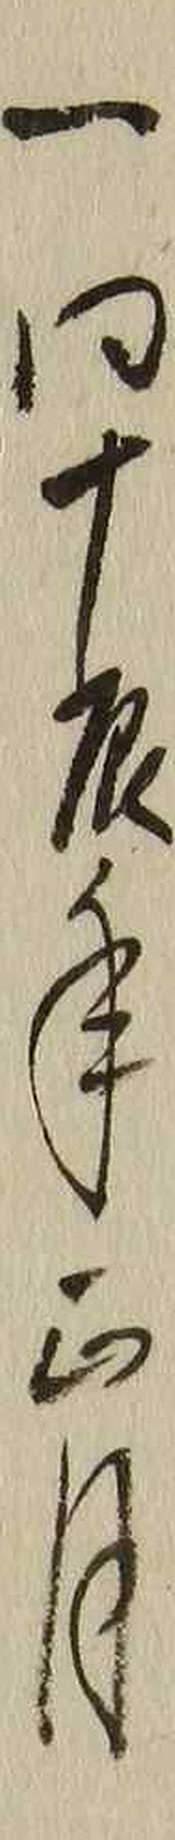一同十辰年正月
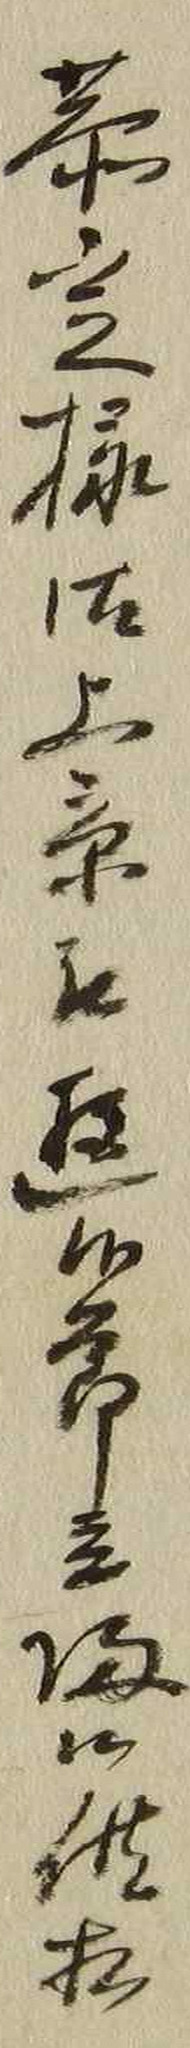恭定様御上京被遊候節立帰御供相
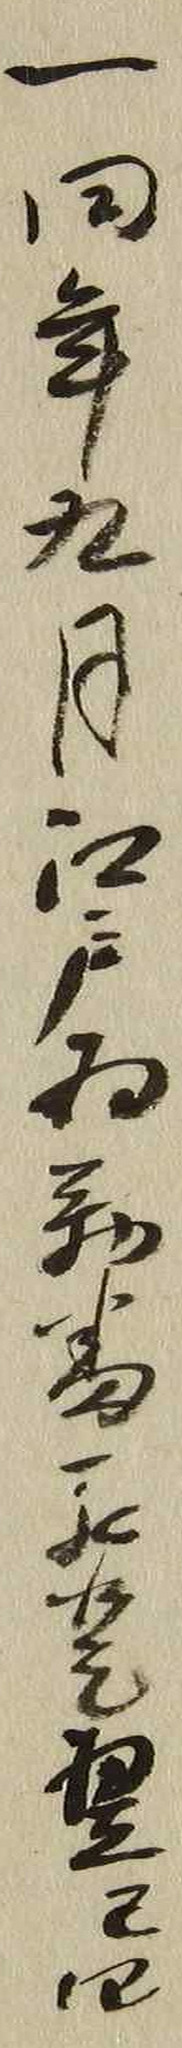一同年九月江戸為勤番罷登翌巳四
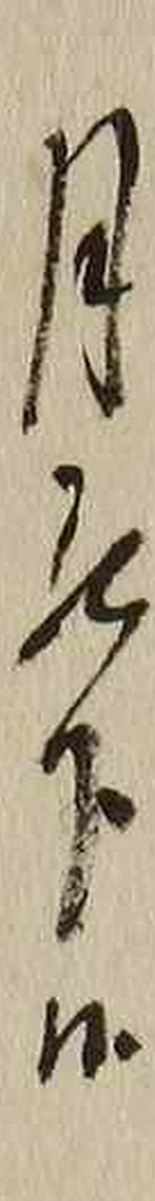月罷下候
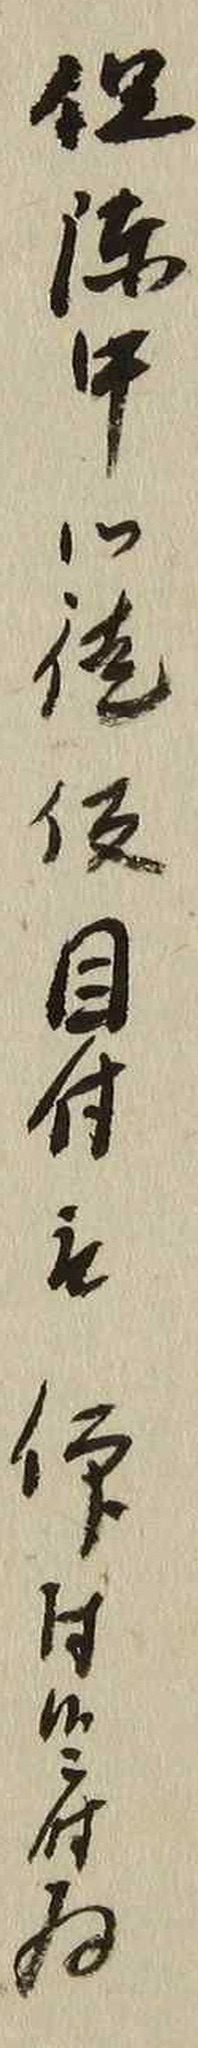但陣中御徒仮目付被仰付候ニ付為
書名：諸士系譜　巻之360　す之部10
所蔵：会津若松市立会津図書館
